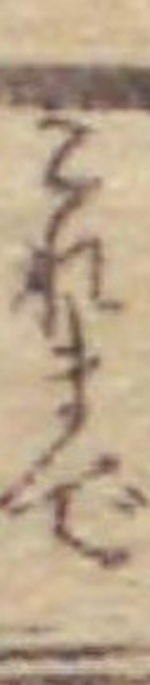これまで
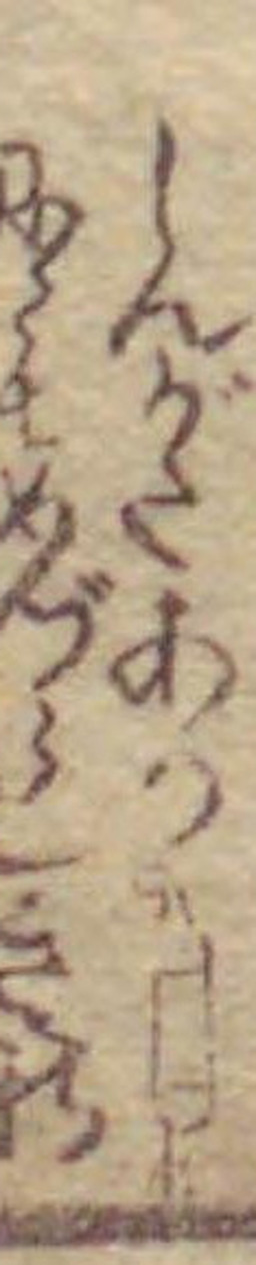にもめづらしき新
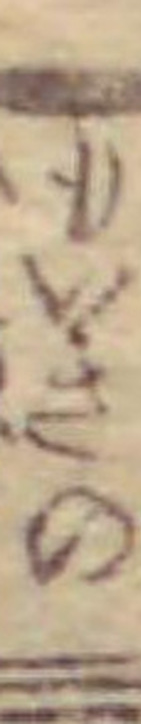もいきの
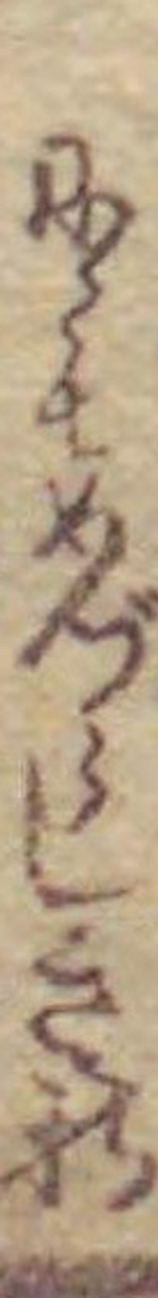にもめづらしき新
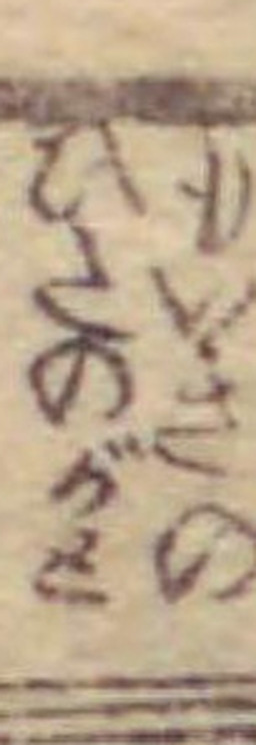ひたのがと
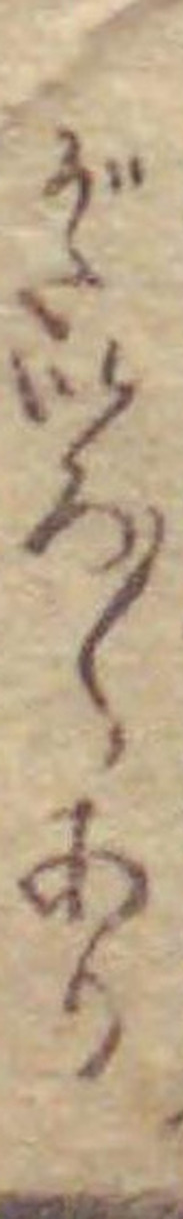がたいろ〳〵あり
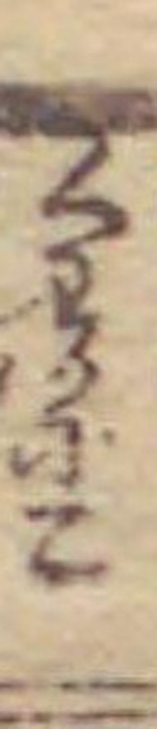くわかにこ
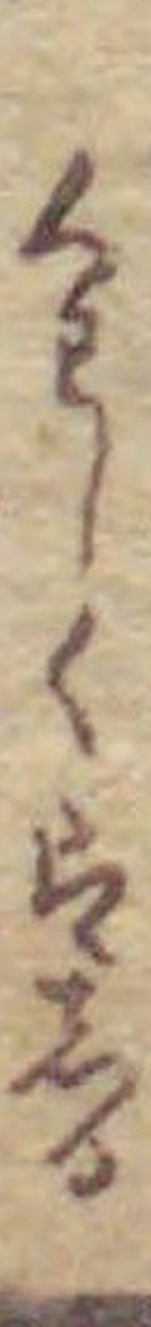くわしく占しる
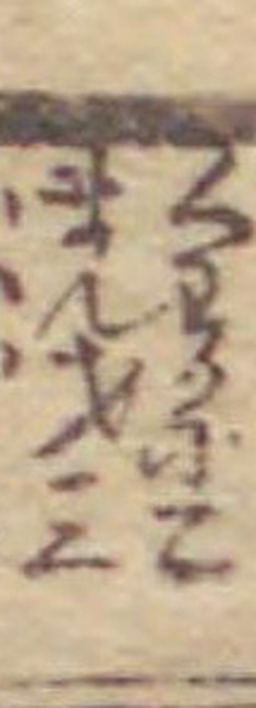まん才三
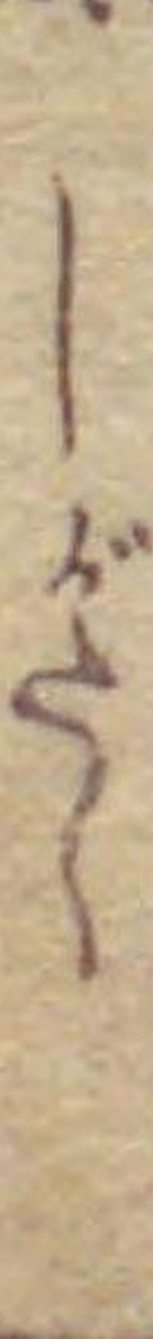しがたし
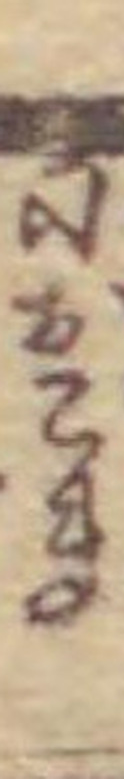におごま
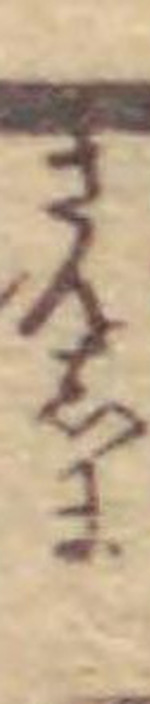さんしま
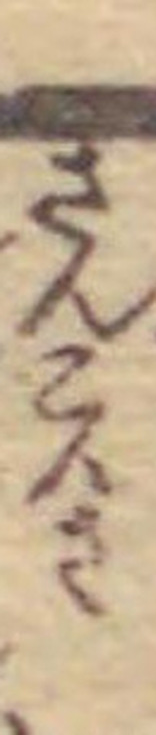さんこんさ
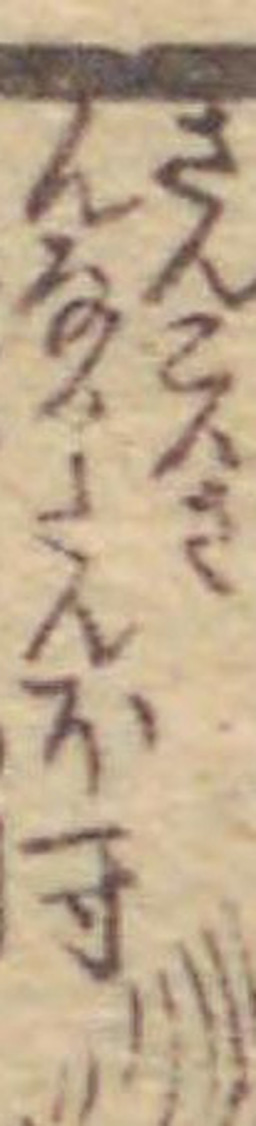んなるたんほ一寸
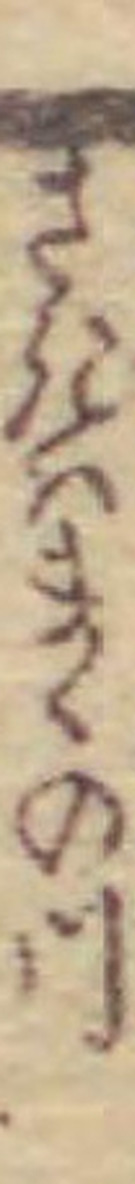さきはまゝの川
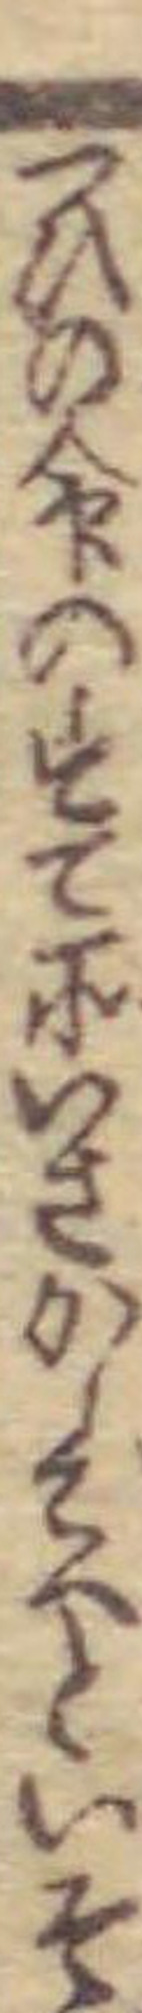つひの命のすて所いさかしこへといそぎゆく
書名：御誂染長寿小紋 : 3巻
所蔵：国立国会図書館 National Diet Library, JAPAN
